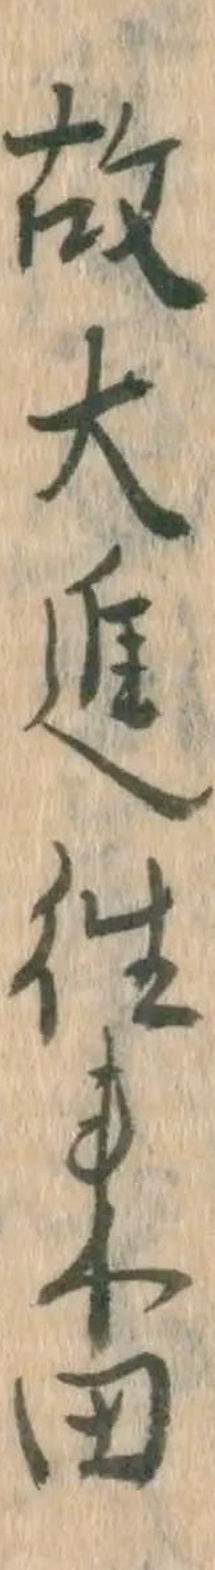故大進往来田
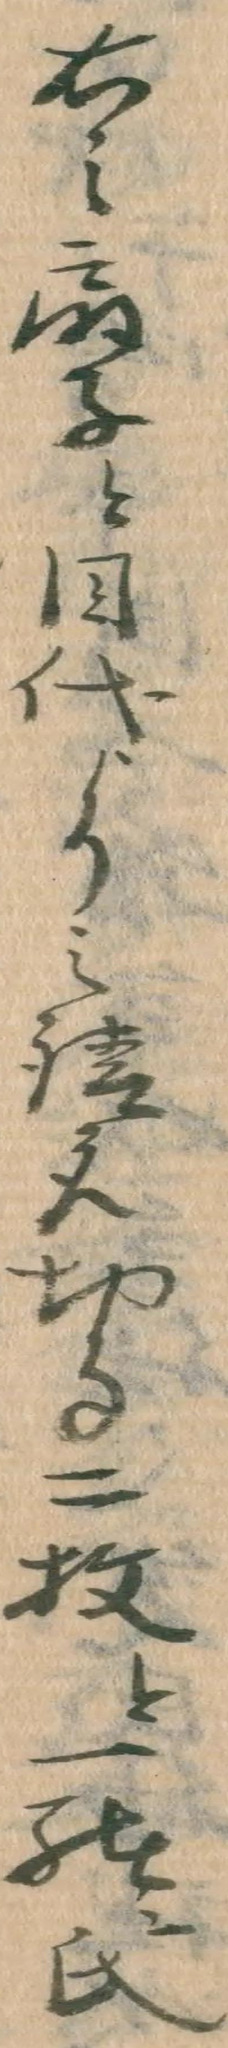右之扇子と目代より之請取、切手二枚と一緒に氏
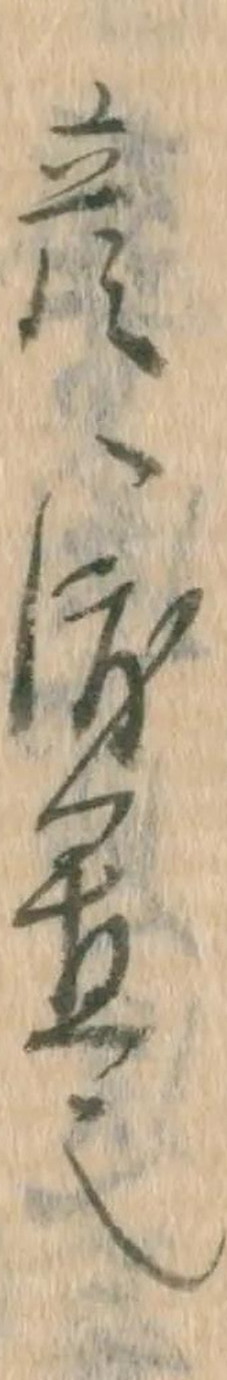彦へ渡置也
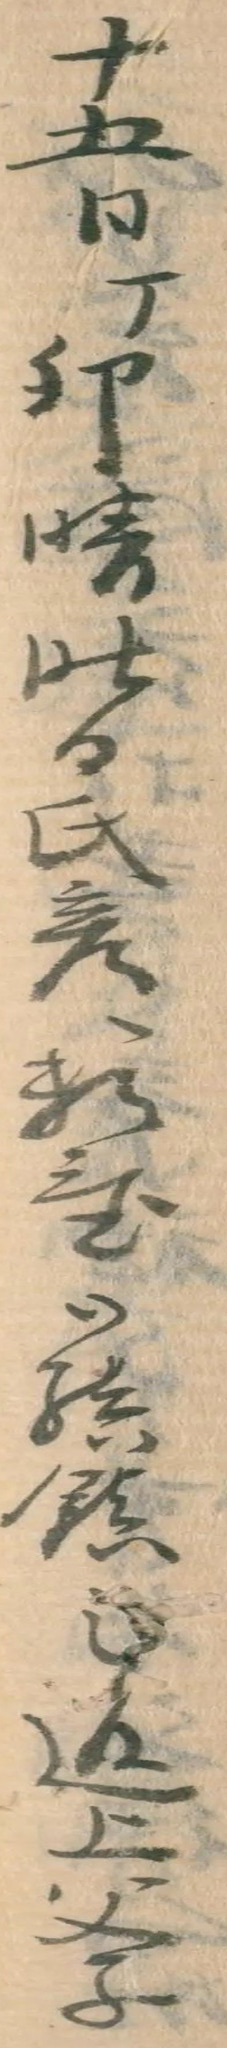十五日丁卯晴、此日氏彦へ頼置御結鎮之返上、父子
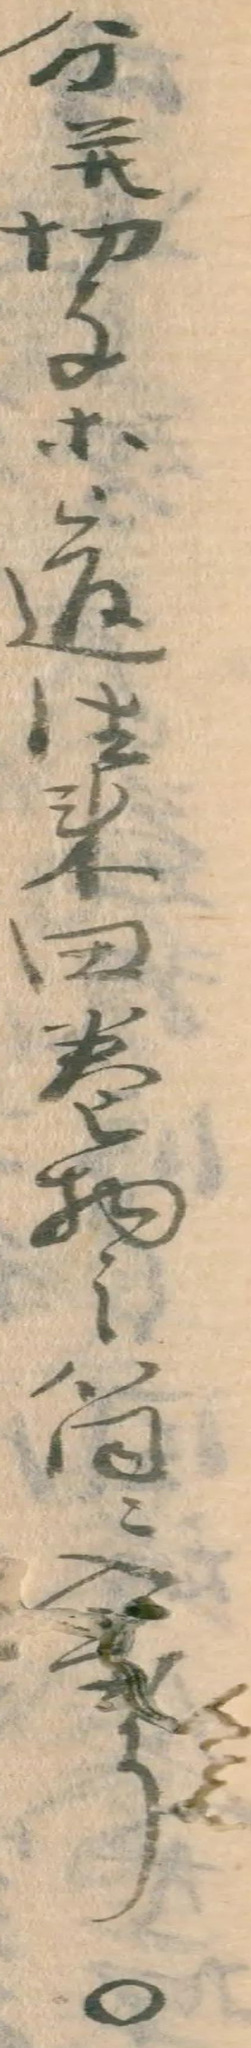分并切手等御返、往来田巻物之筒ニ入置了、○
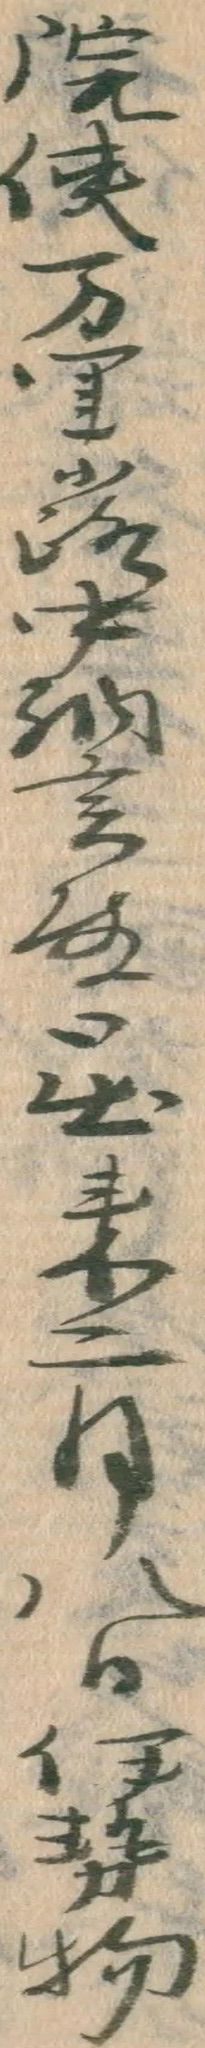院使万里小路中納言殿御出来、二月八日伊勢物
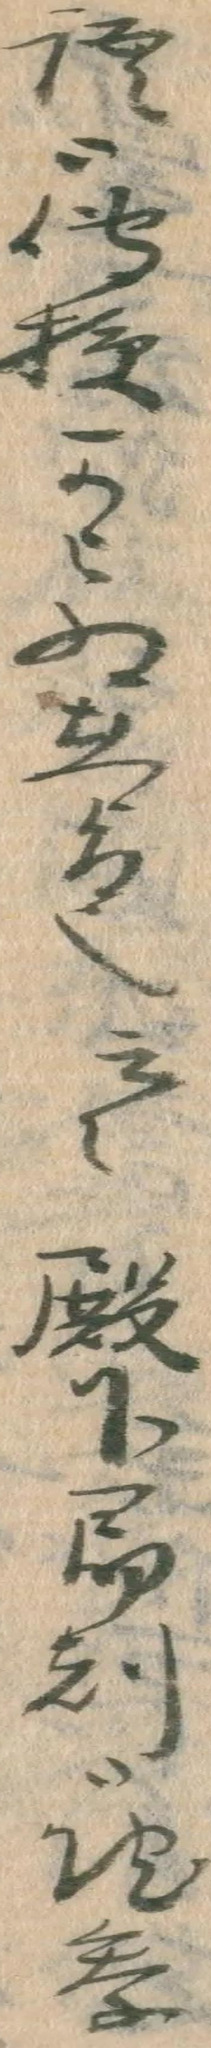語御傳授、可被為在旨也云〻、殿下即刻御院参
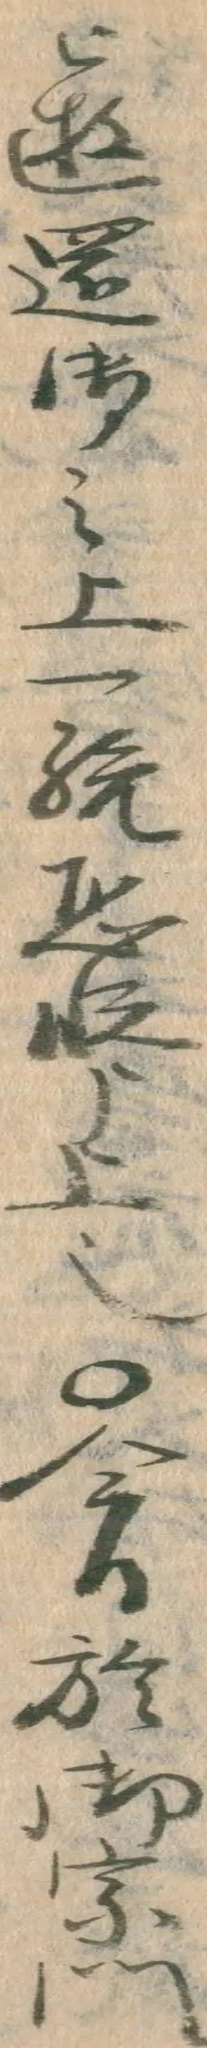被遊、還御之上一統恐悦申上也、○今日於御家門
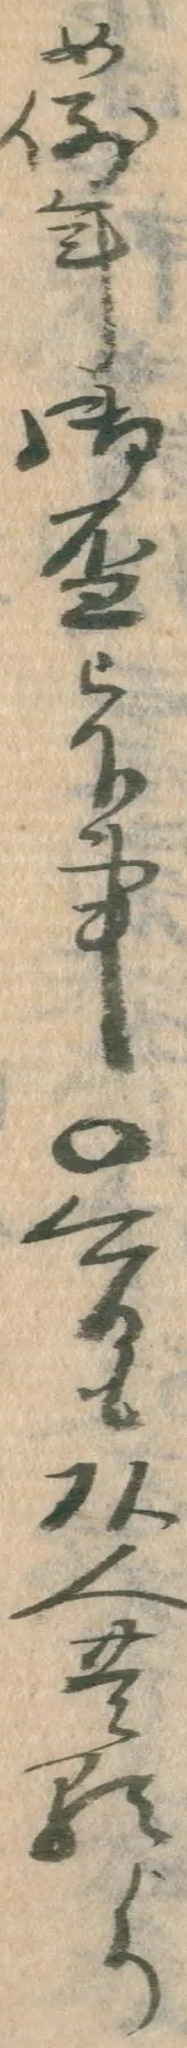如、例年御盃被下事、○今日も頭人豊顕より
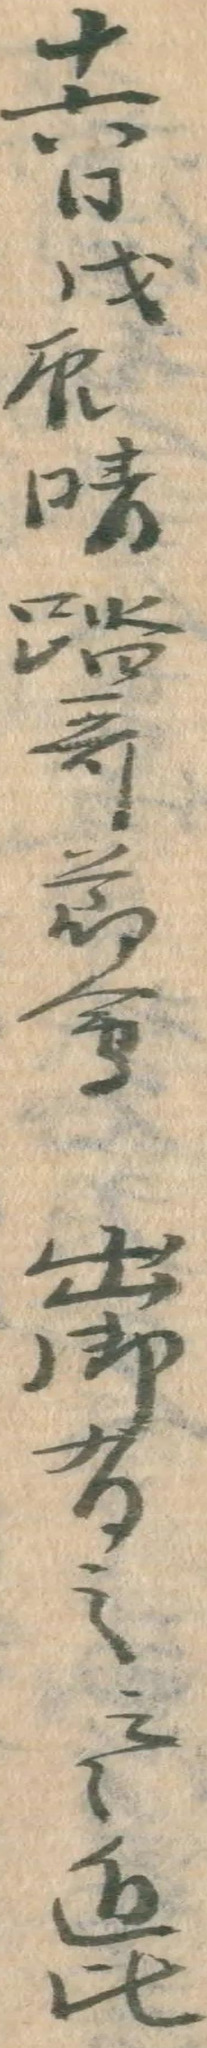十六日戊辰晴、踏歌節会、出御有之云々、近比
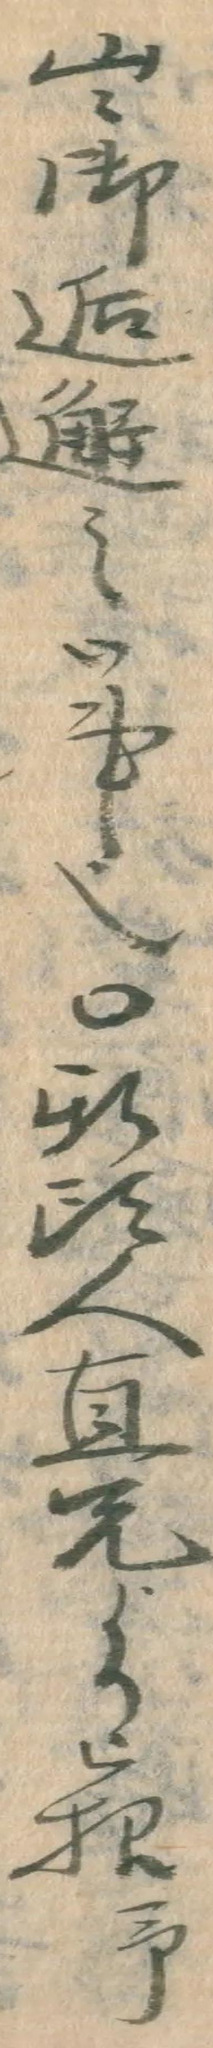出御邂逅之御事也、○新頭人直元より被招、予
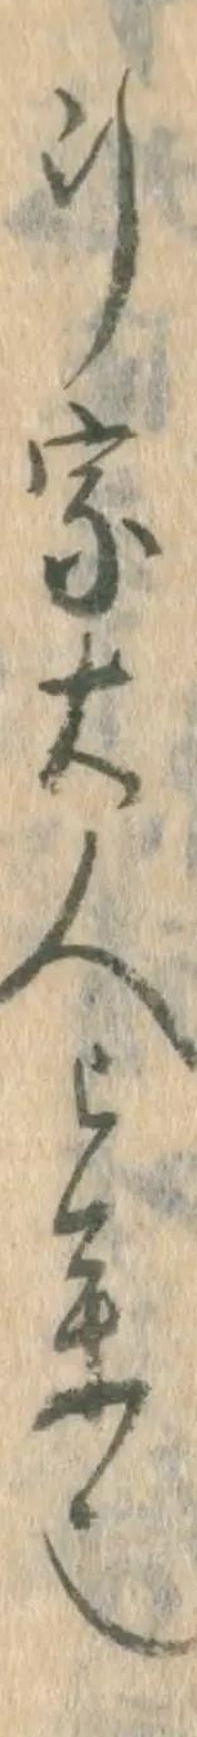引家大人被参也、
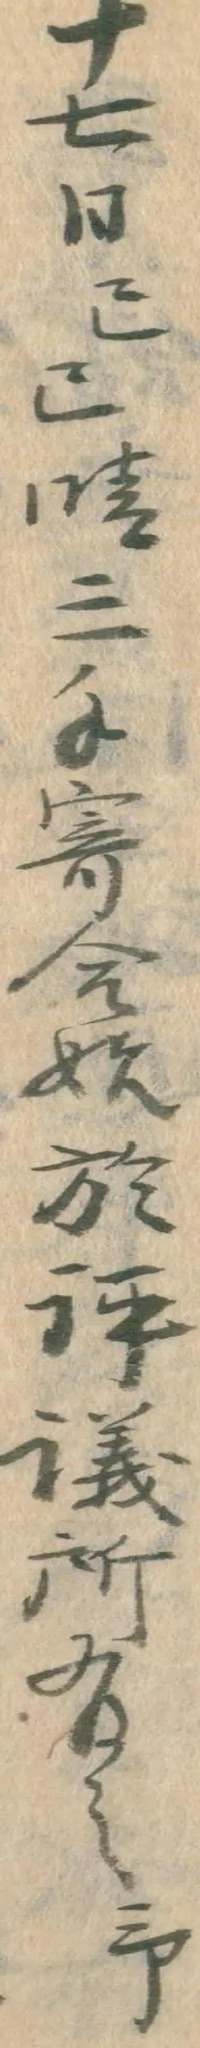十七日己巳晴、三手寄合始、於評議所有之、予
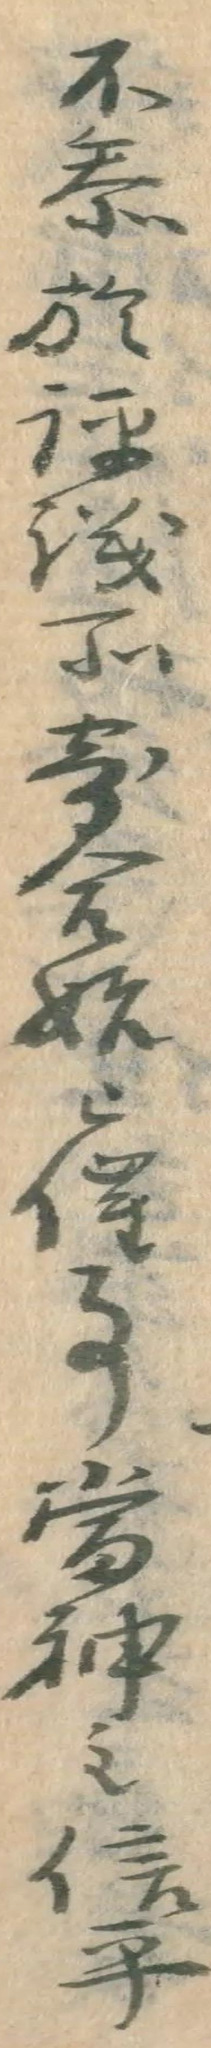不参、於評議所寄合始被催事、當神主信平

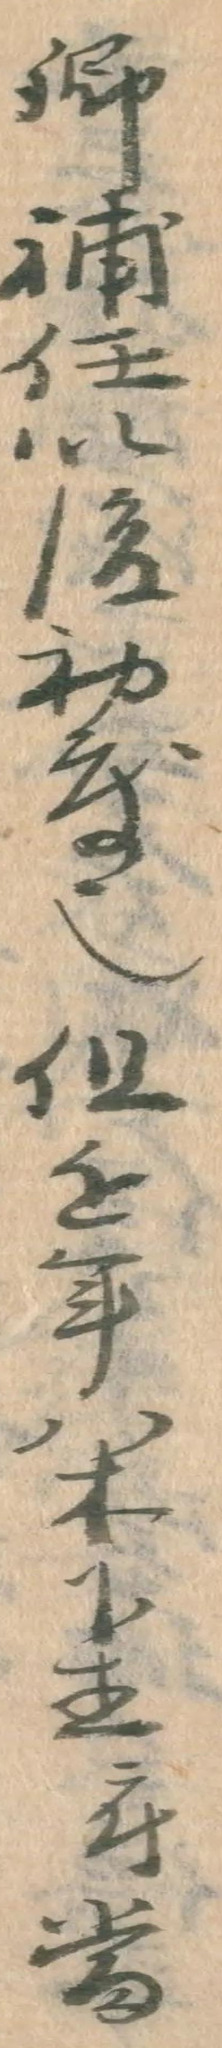卿補任以後初度也、但近年米下直ニ付、當
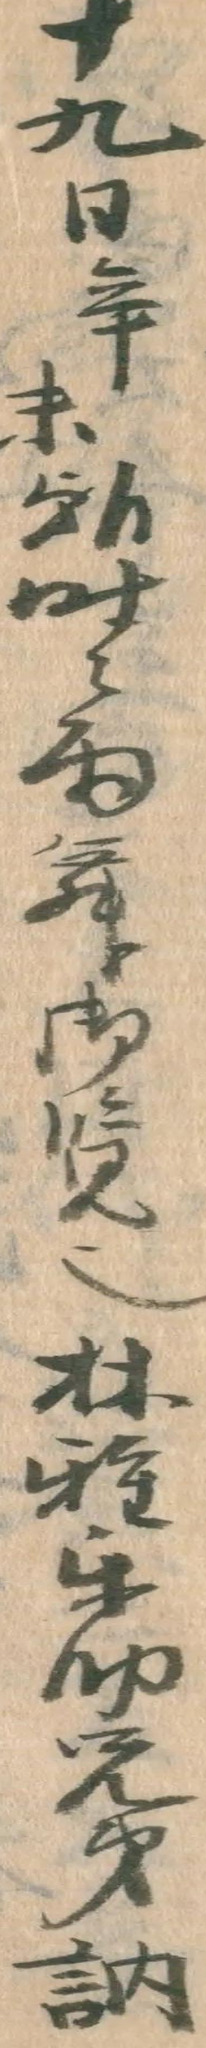十九日辛未朝時々雨、舞御覧也、林雅楽助兄弟納
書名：賀茂社記録. 第63冊
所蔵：国立国会図書館 National Diet Library, JAPAN
